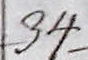34
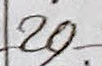29
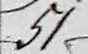51
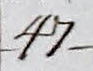47
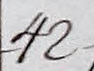42
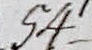54
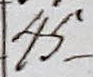45
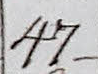47
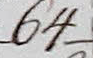64
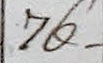76
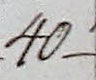40
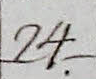24
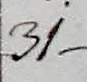31
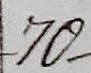70
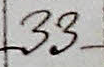33
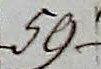59
